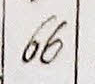66
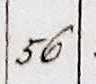56
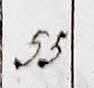55
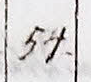54
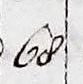68
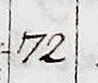72
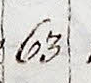63
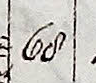68
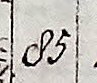85
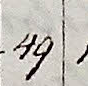49
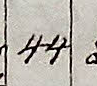44
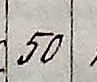50
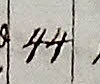44
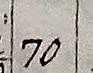70
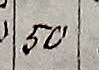50
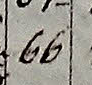66
